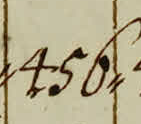456
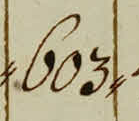603
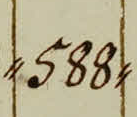588
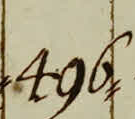496
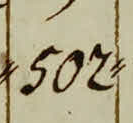502
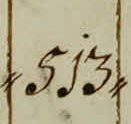513
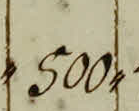500
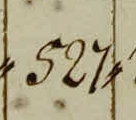527
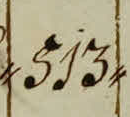513
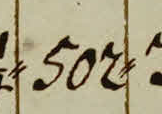502
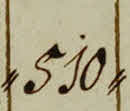510
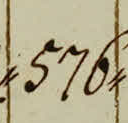576
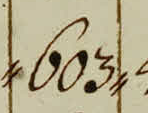603
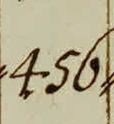456
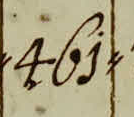461
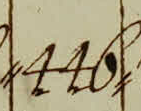446
